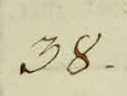38
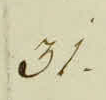31
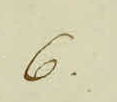6.
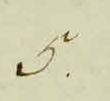5.
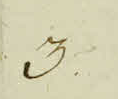3.
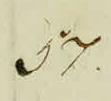57
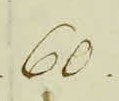60
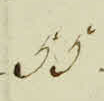55
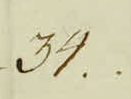34.
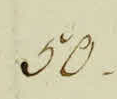50
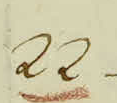22
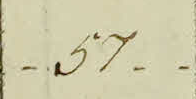- 57 -
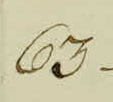63
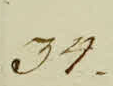34
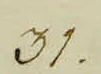31
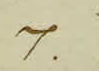7.
